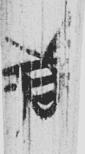者
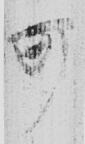可
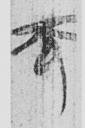而
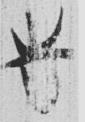告
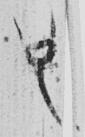也
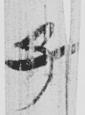子
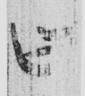曰
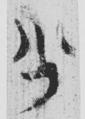少（小）
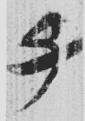子
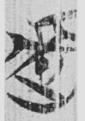來
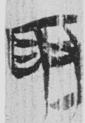取
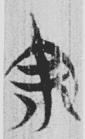余
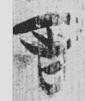言
